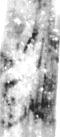朝
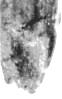啟
